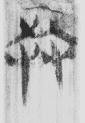共
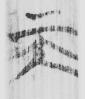天
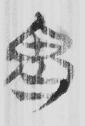畏
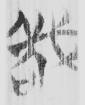敬
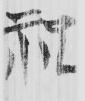祀
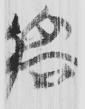{弔口}
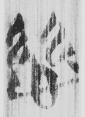慈
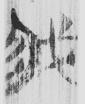我
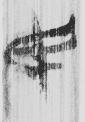民
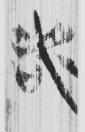若
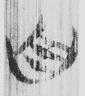自
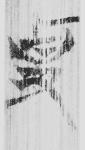史
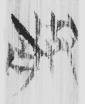朕
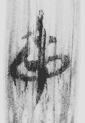身
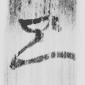也
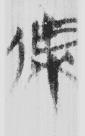傑
